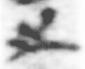之
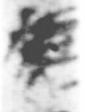騏
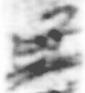爲
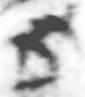○（右）
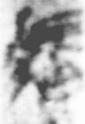○（服）
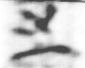之
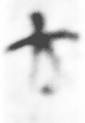大
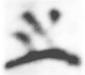之
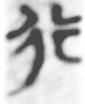行
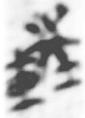○（廣）
